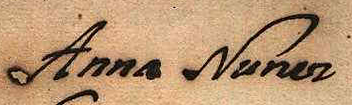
Anna Nunez
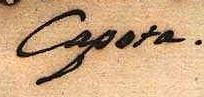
Capota.
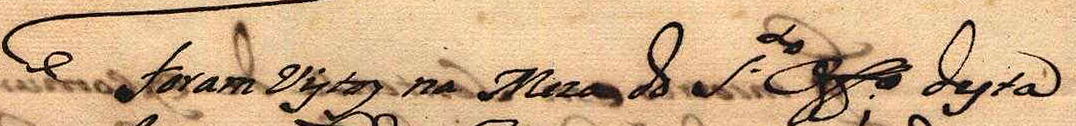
e foram vistos na Meza do S.to Off.o desta
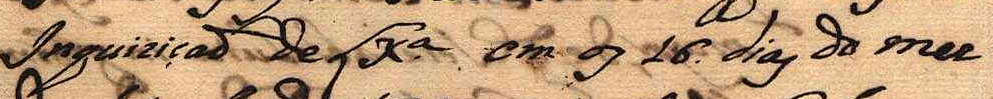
Inquizição de Lx.a em os 16. dias do mez
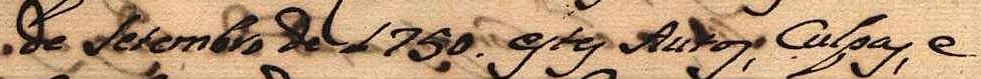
de Setembro de 1750. estes Autos, Culpas e
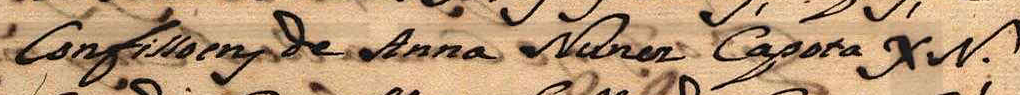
Confissoens de Anna Nunez Capota X. N.
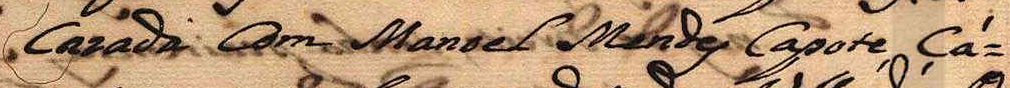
cazada com Manoel Mendes Capote, Ça
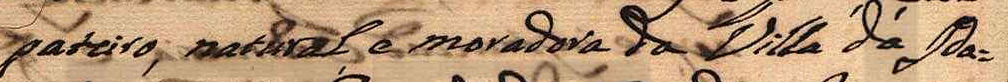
pateiro, natural e moradora da Villa da Jda
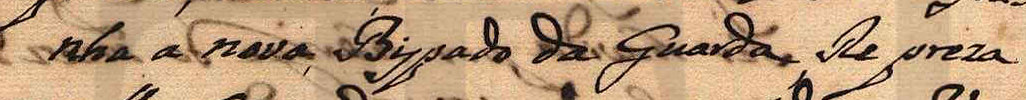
nha a nova Bispado da Guarda Re preza
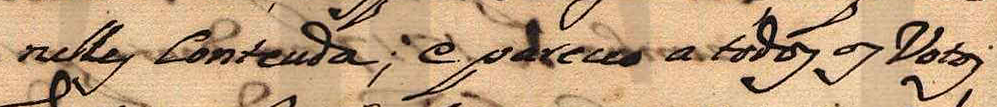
nelles Conteuda; e pareceo a todos os Votos
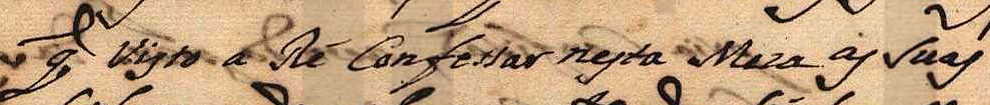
q̄ visto a Ré Confessar nesta Meza as suas
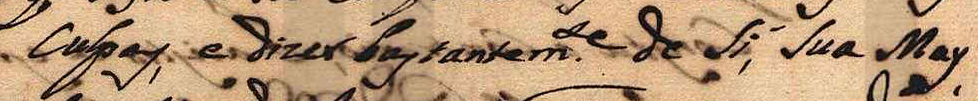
culpas, e dizer bastantem.te de si, sua May
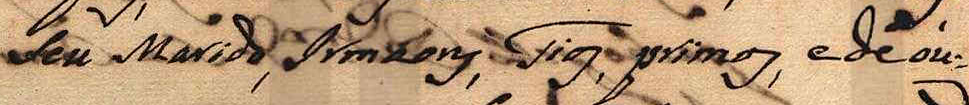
seu Marido Irmaons, Tios, primos, e de ou
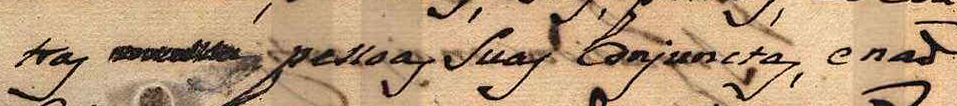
tras __ pessoas suas Conjunctas, e naõ
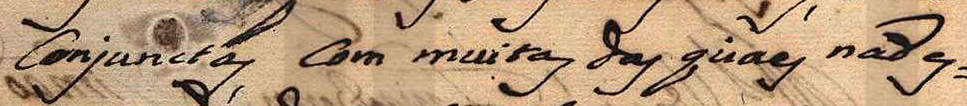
Conjunctas com muitas das quaes naõ es
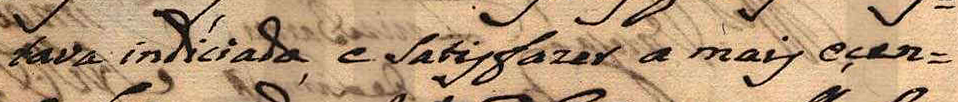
tava indiciada, e satisfazer a mais eçan
